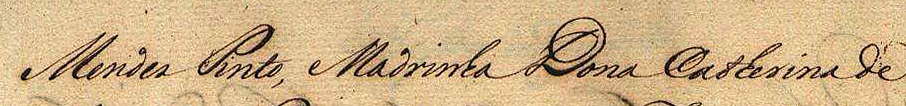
Mendes Pinto Madrinha Dona Catherina de
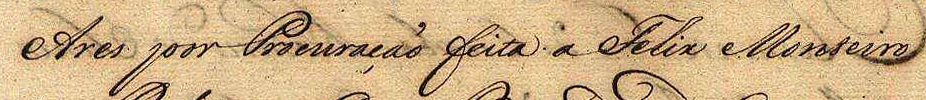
Ares por Procuraçaõ feita a Felix Monteiro
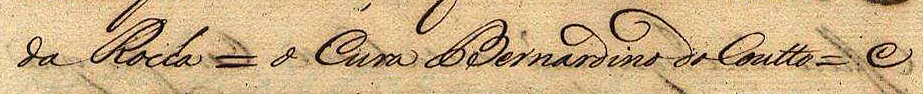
da Rocha = o Cura Bernardino do Coutto= e
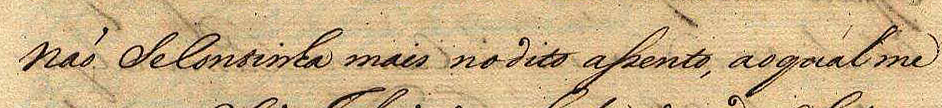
naõ Se Continha mais no dito assento, ao qual me
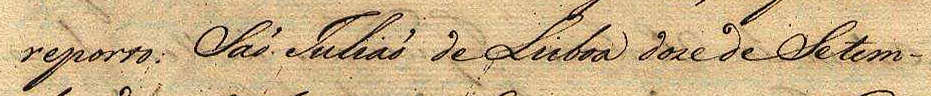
reporto: Saõ Iuliaõ de Lisboa doze de Setem
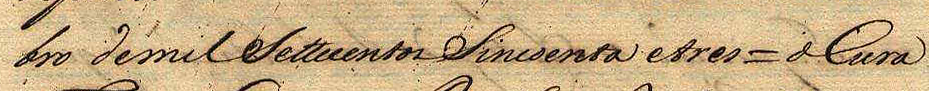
bro de mil Settecentos Sincoenta e tres = o Cura
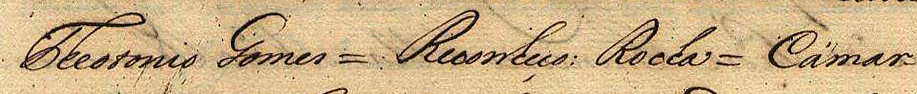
Theotonio Gomes = Reconheço: Rocha = E á mar
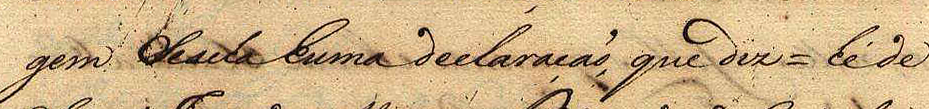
gem Se acha huma declaraçaõ, que diz = hé de
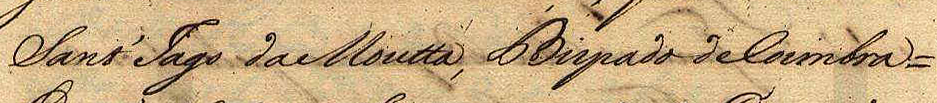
Sant'Iago da Moutta, Bispado de Coimbra
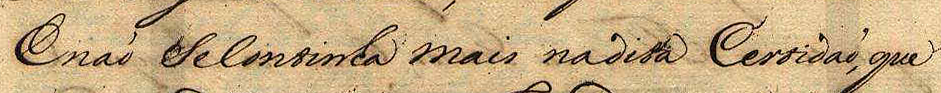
E naõ Se Continha mais na dita Certidaõ, que
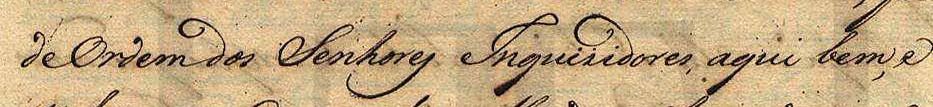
de Ordem dos Senhores Inquizidores aqui bem, e
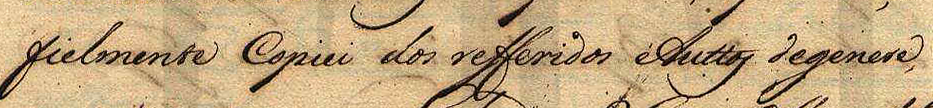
fielmente Copiei dos refferidos Auttos de genere,
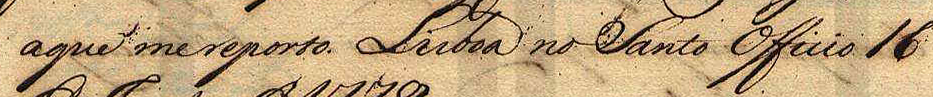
a que me reporto. Lisboa no Santo Officio 16
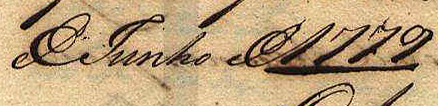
d̄ Iunho d̄ 1779
